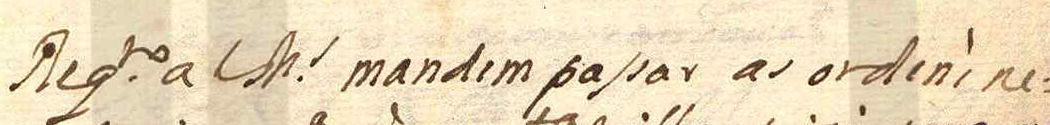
Req.ro a V M.s mandem passar as ordens ne
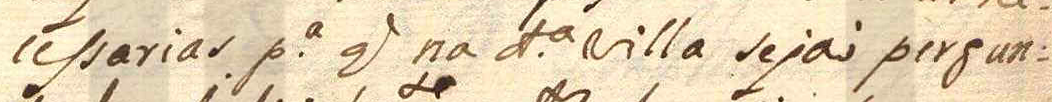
cessarias p.a q̄ na d̄.a villa sejaõ pergun
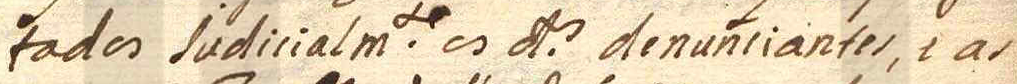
tados Iudicialm.te os d̄.s denunciantes, e as
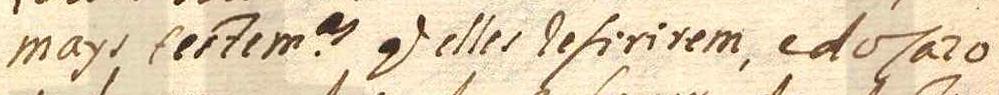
mays testem.as q̄ elles refirirem, e do Cazo
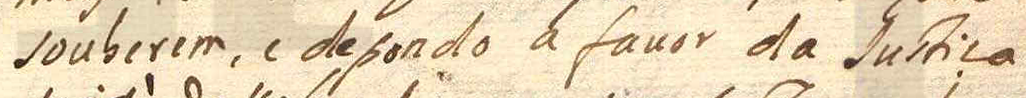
souberem, e depondo a fauor da Iustiça
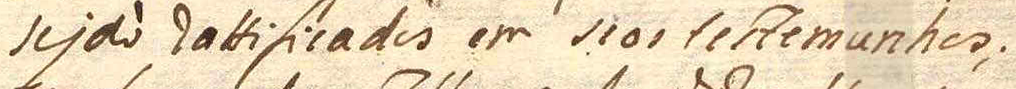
sejaõ Rattificados em seos testemunhos,
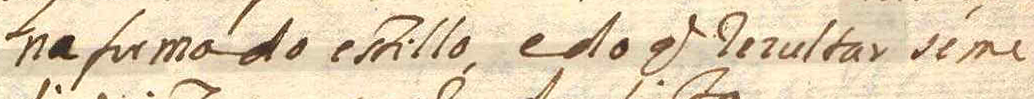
na forma do estillo, e do q̄ Rezultar se me
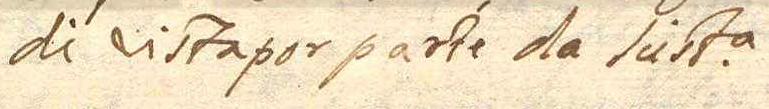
de vista por parte da Iust.a
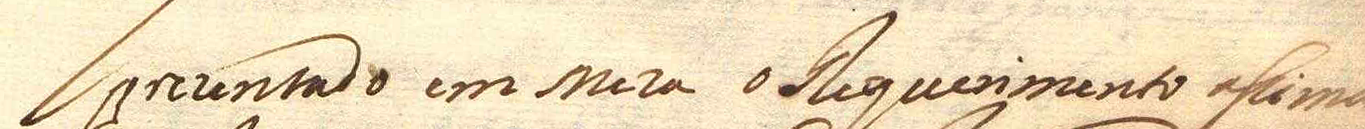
E prezentado em Meza o Requerimento assima
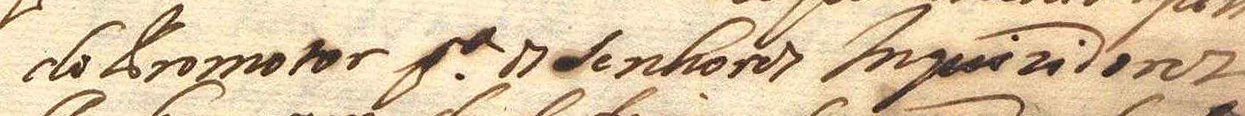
do Promotor p.a os Senhores Inquizidorez
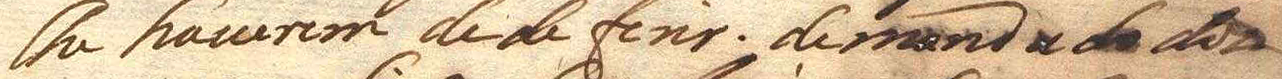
lhe hauerem de deferir. de mandado dos
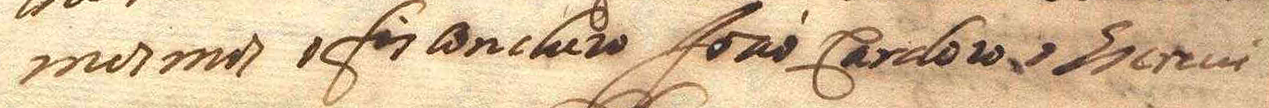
mesmos o fis concluzo Joaõ Cardozo o Escreui
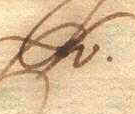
Clo.
